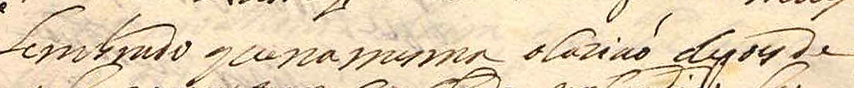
Lembrado que na mesma ocaziaõ depois de
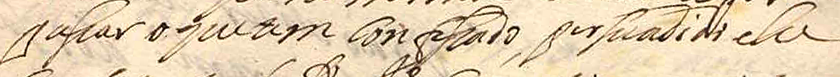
passar o que tem confessado, persuadido elle
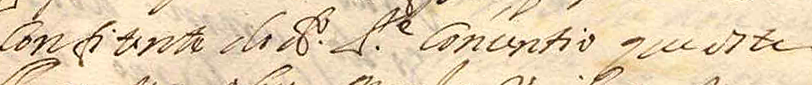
Confitente do d̄.o P.e concentio, que este
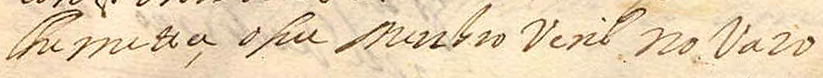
lhe meteo, o seu membro veril no vazo
